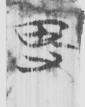卑
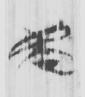民
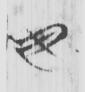母
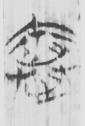{舂心}
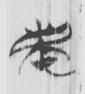民
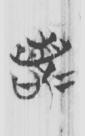若
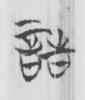誥
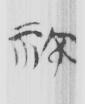祅
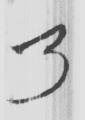乃
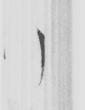丨
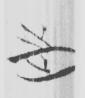{止之}
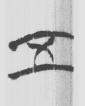五
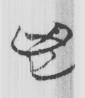兇
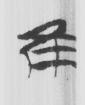隹
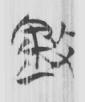{金攴}
